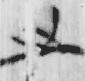之
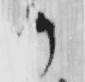人
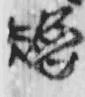○（胡）
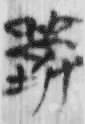襄
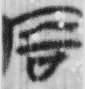石
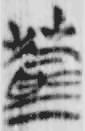蒼
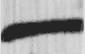一
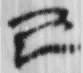己
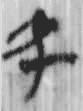丑
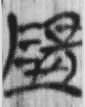○（陽）
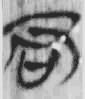君
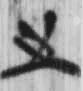之
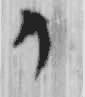人
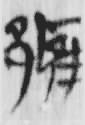○（雁）
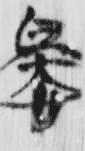懌
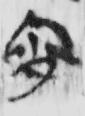宵
